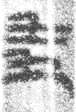○（吾）
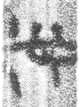幾
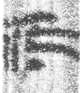不
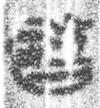智（知）
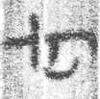也
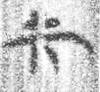夫
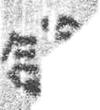周
